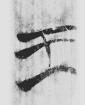王
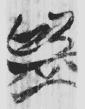監
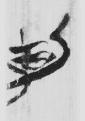劼
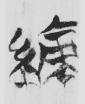{糸朿}
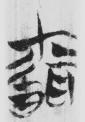{尒䎽}
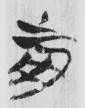前
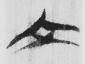文
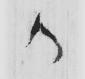人
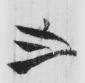之
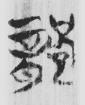{龍兄}
